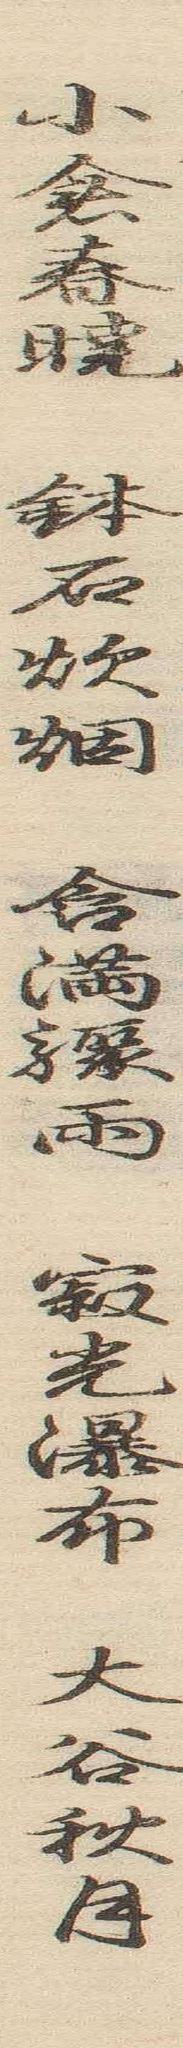小倉春曉鉢石炊烟含満驟雨寂光瀑布大谷秋月

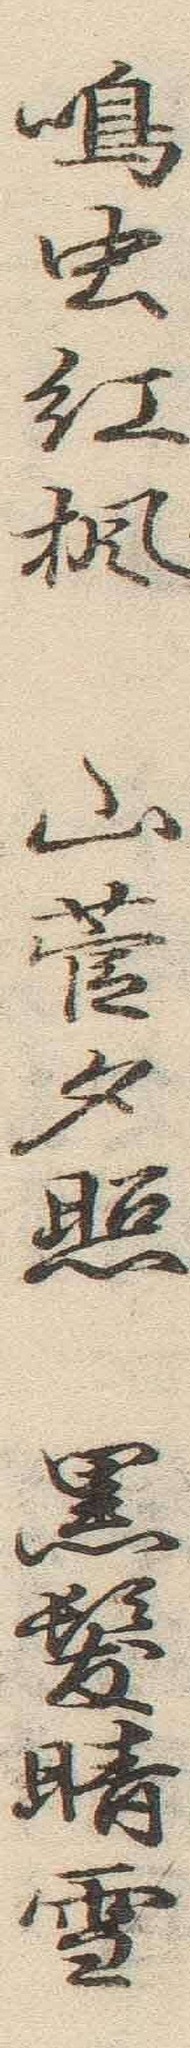鳴虫紅楓山菅夕照黒髪晴雪
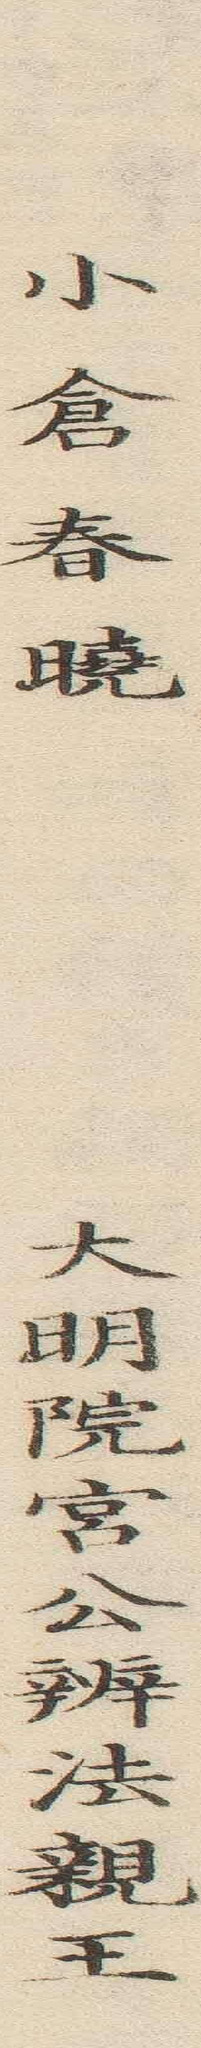小倉春曉大明院宮公辨法親王
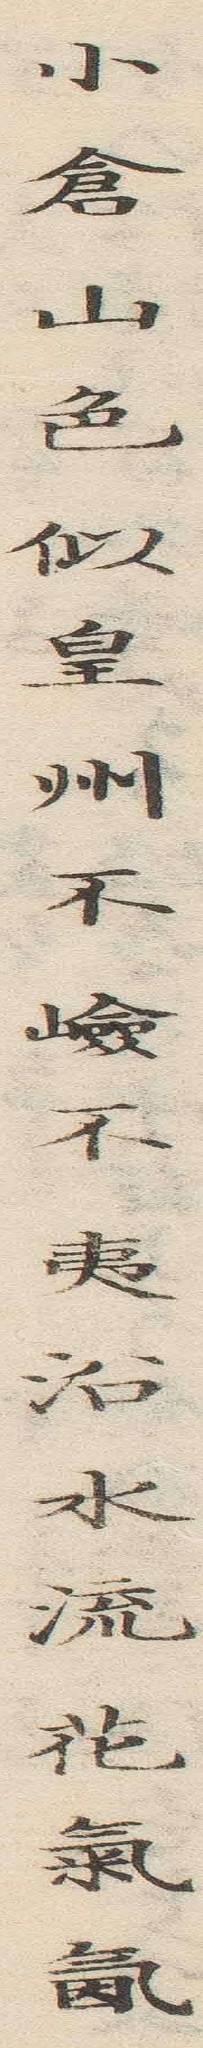小倉山色似皇州不嶮不夷沿水流花氣氤
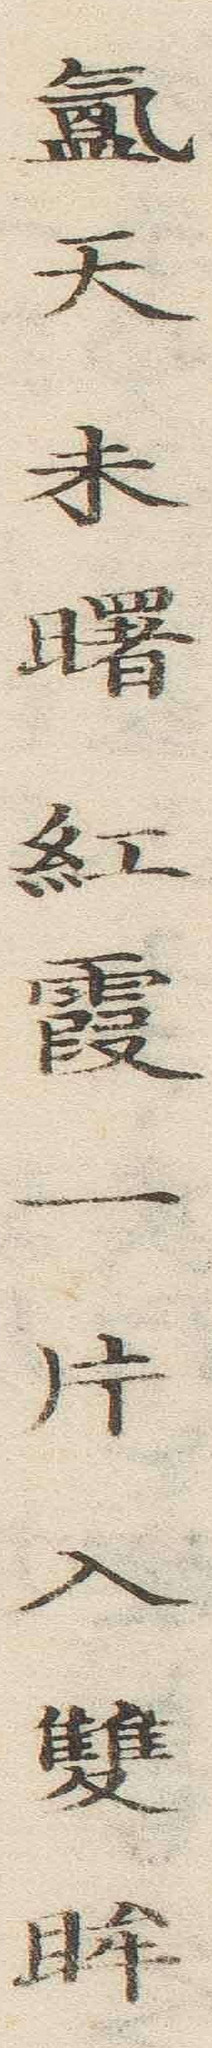氳天未曙紅霞一片入雙眸
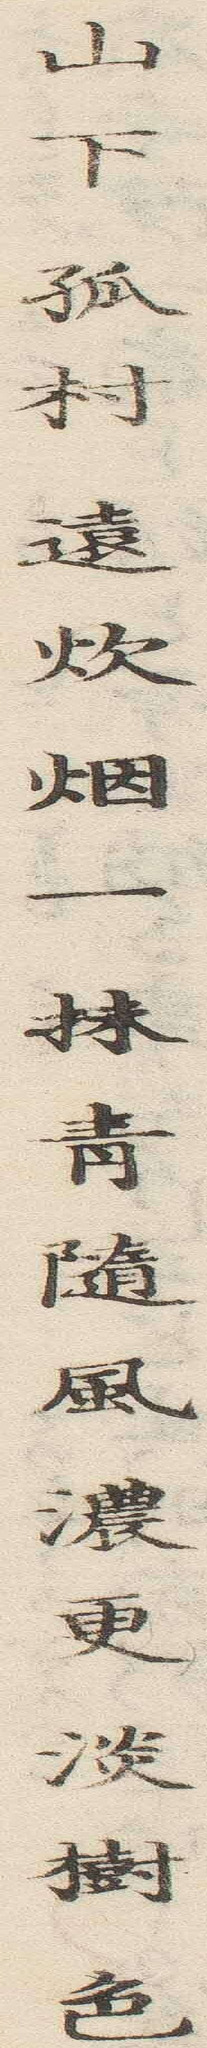山下孤村遠炊烟一抹靑隨風濃更淡樹色
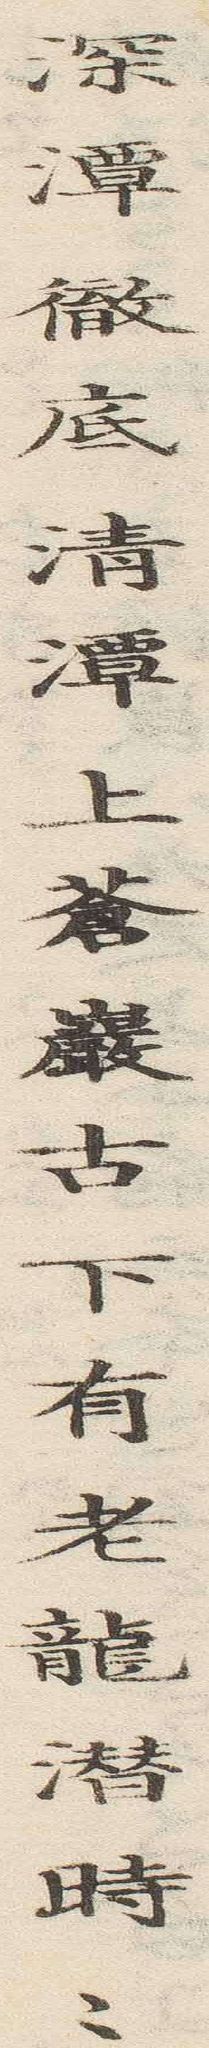深潭徹底淸潭上蒼巖古下有老龍潜時〻
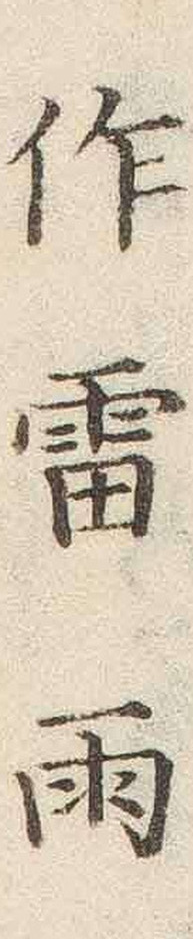作雷雨
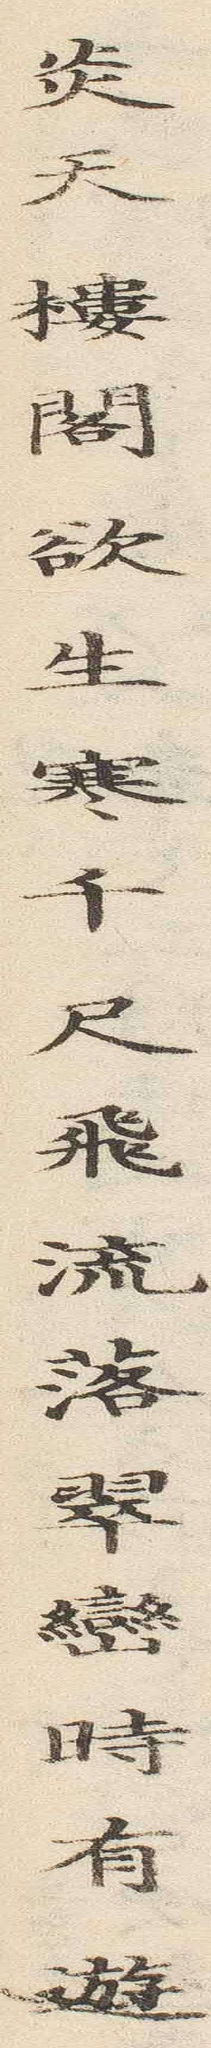炎天樓閣欲生寒千尺飛流落翠巒時有遊
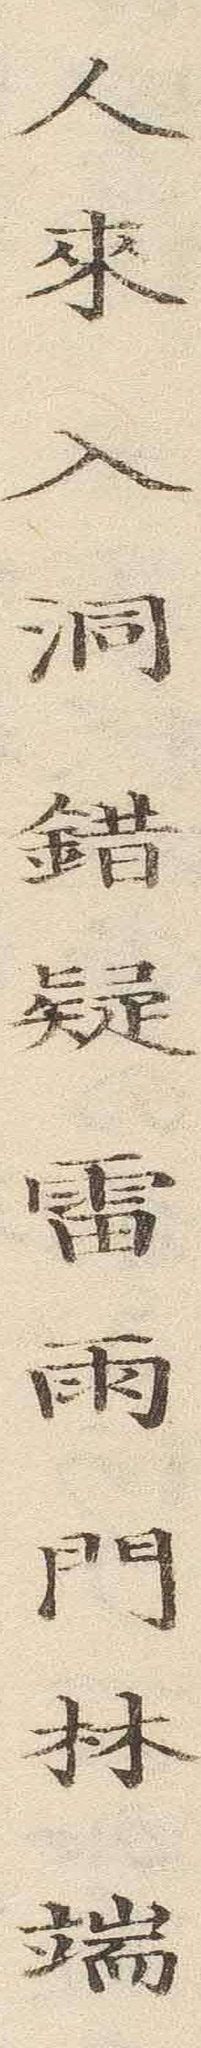入來入洞錯疑雷雨門林端
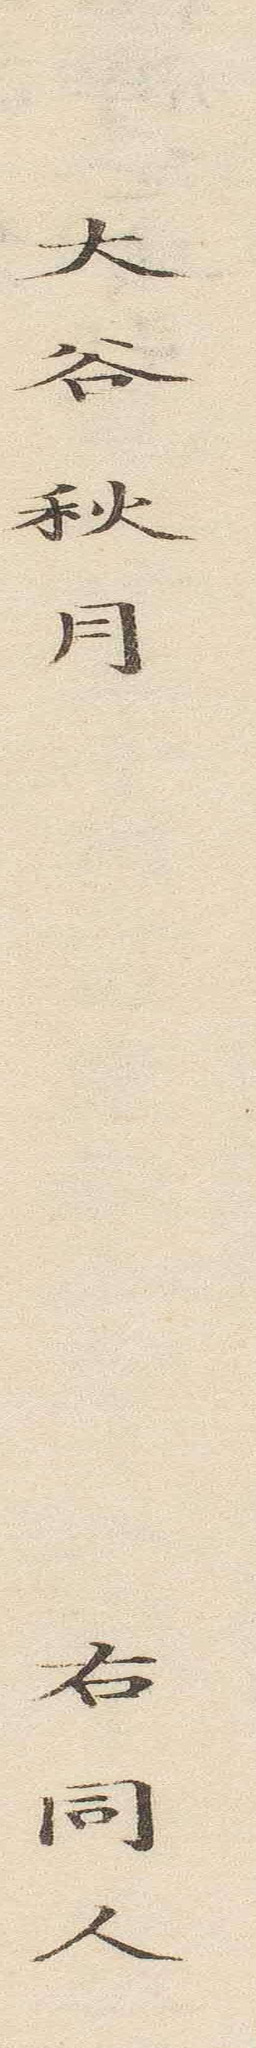大谷秋月右同人
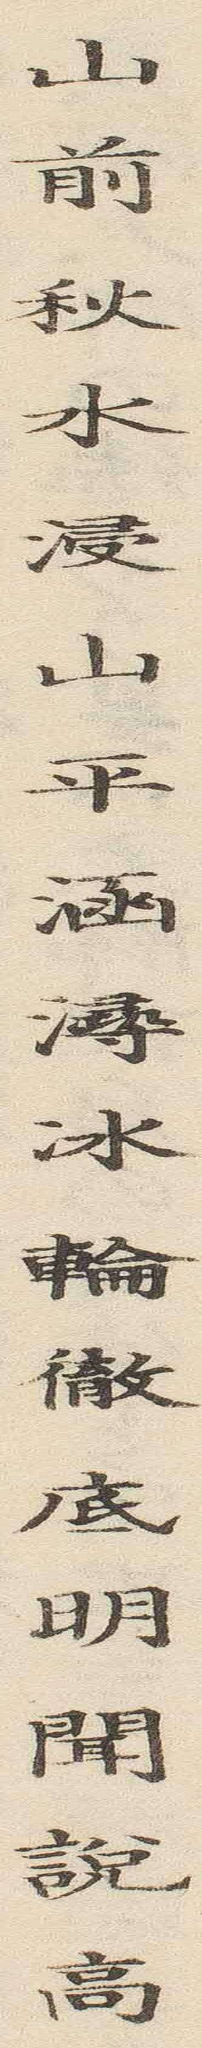山前秋水浸山平涵潯冰輸徹底明聞說高
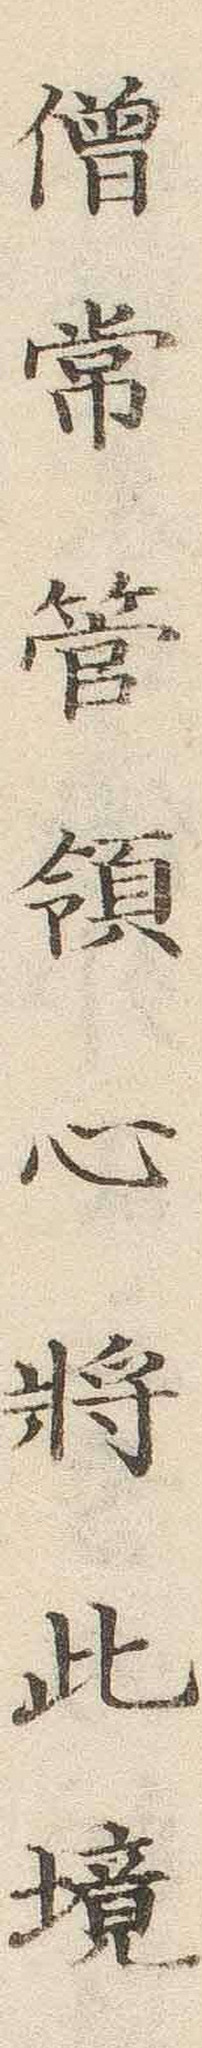僧常管領心將此境
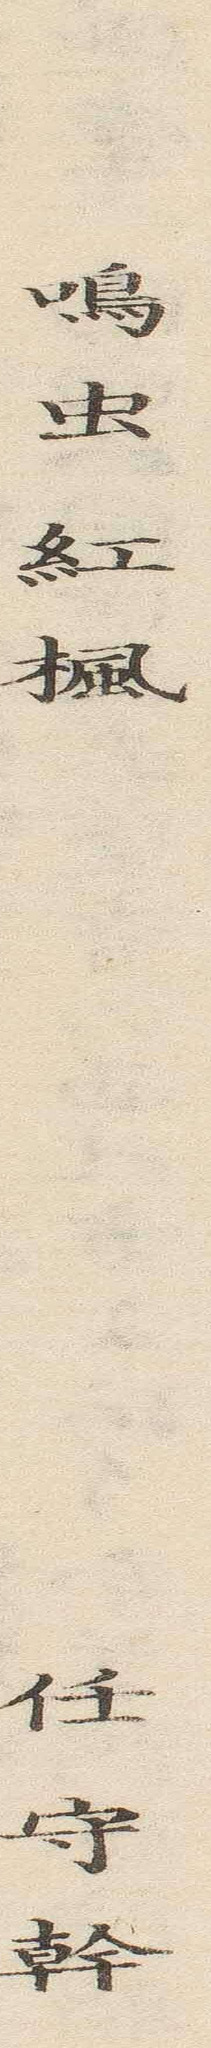鳴虫紅楓任守幹
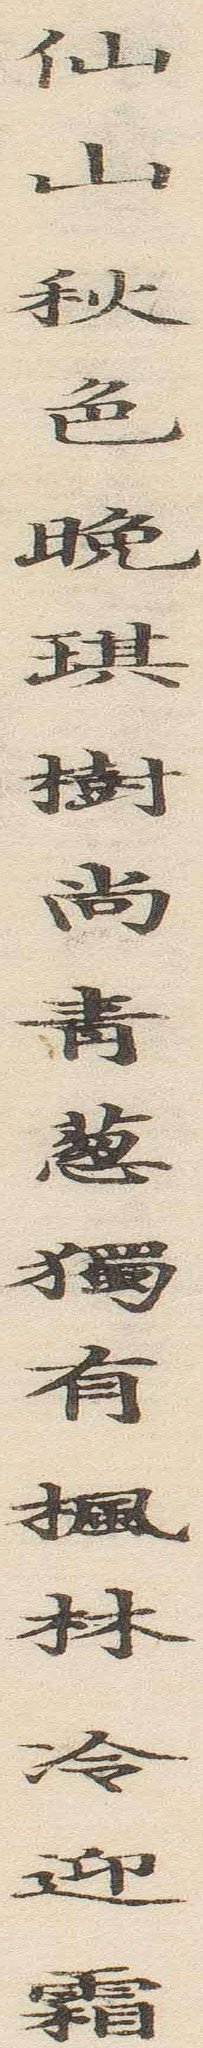仙山秋色晩琪樹尚靑葱獨有楓林冷迎霜
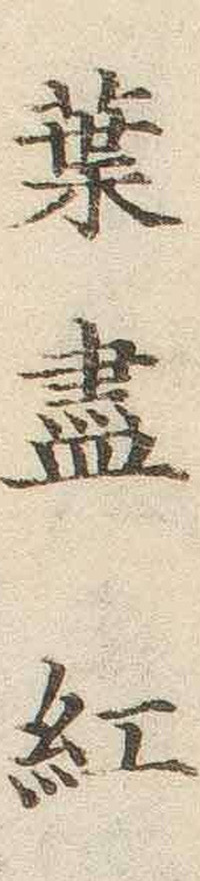葉盡紅
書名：日光山志
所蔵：東京学芸大学附属図書館 国文学研究資料館
